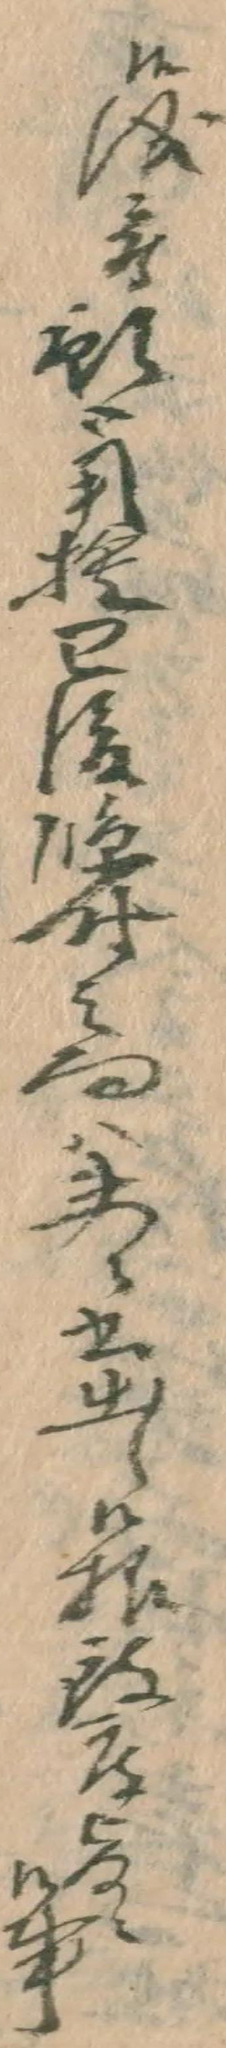候儀ニ付願御用捨已後臨時之向ハ夫々書出し候様致度旨之候事
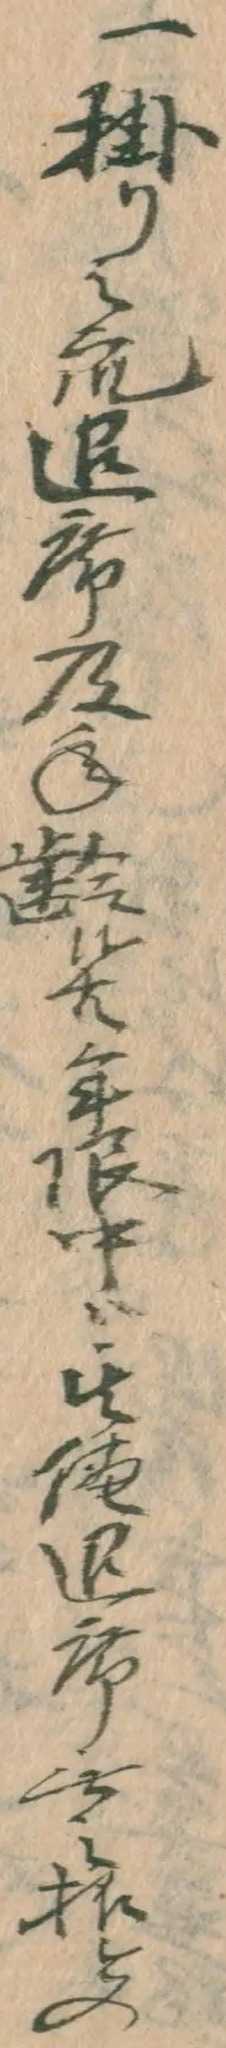一掛り之衆退席及年齢候共年限中は其侭退席無之様との
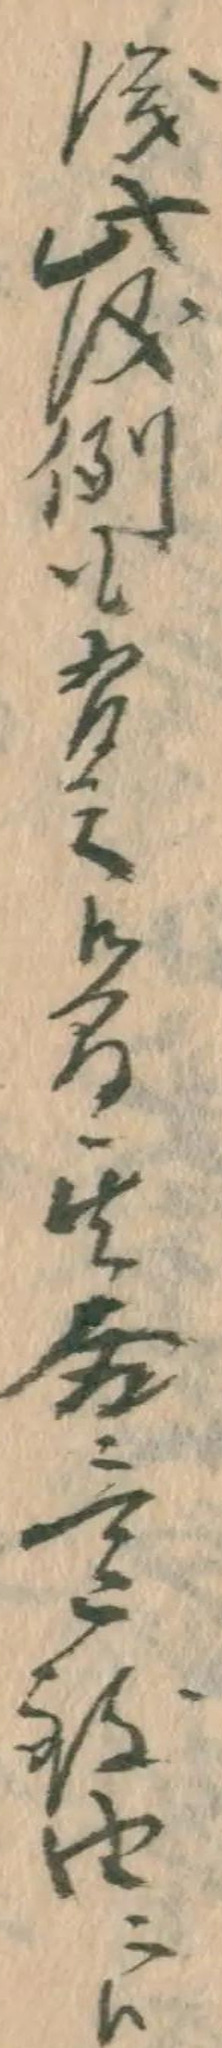儀此儀例も有之候間其分ニ可被致由ニ候
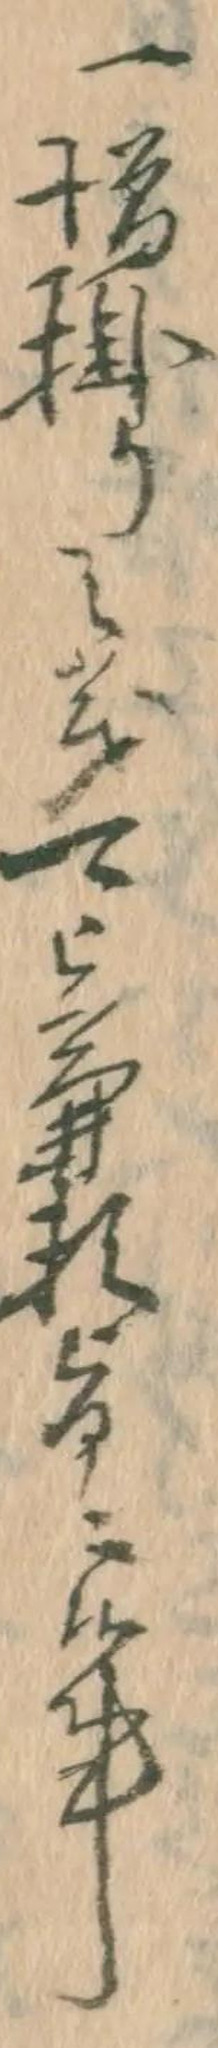一増掛り之義可被兼頼旨ニ候事
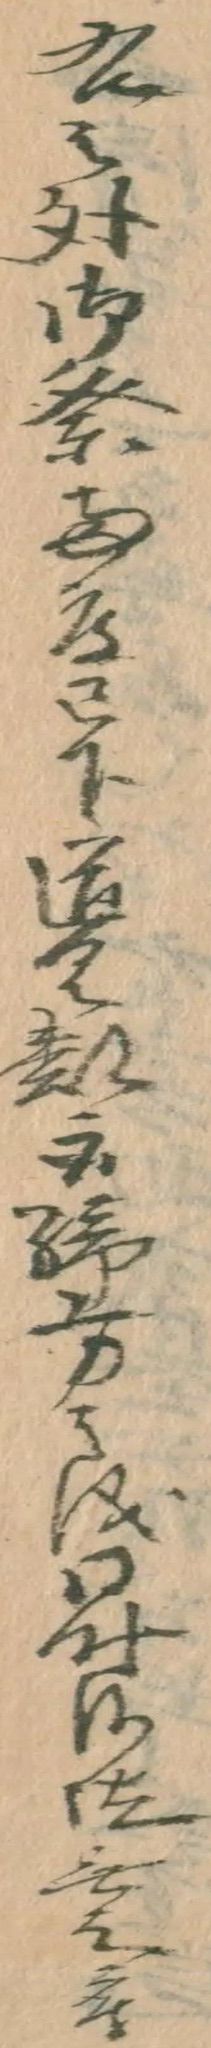右之外御祭両度已下道具類取締方之儀同時沙汰無之ニ付

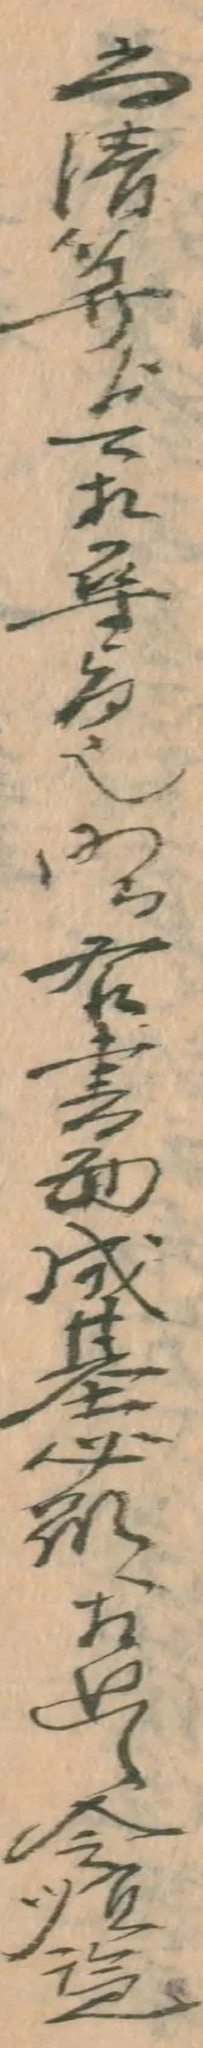尚清算ゟ可相尋旨也仍而右書面成基必顕へ相廻し令順覧了
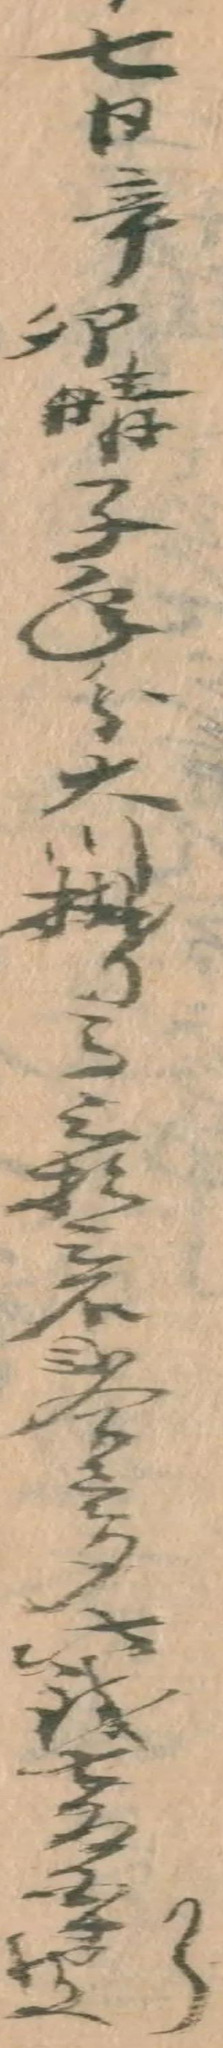十七日辛卯晴子年分大川掛り高三拾三石弐合壱勺此銭七百五十匁
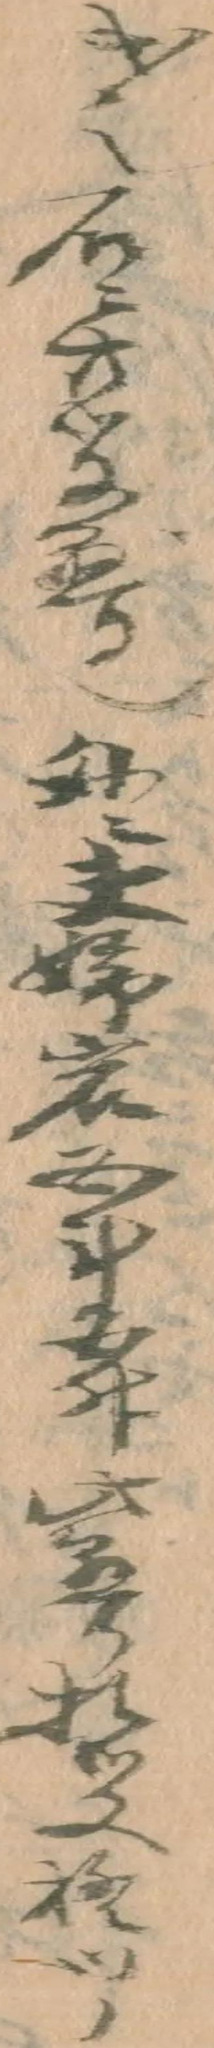出也石二廿四文懸り也外二夫婦岩五斗五升此懸り拾弐文禮種ツノ
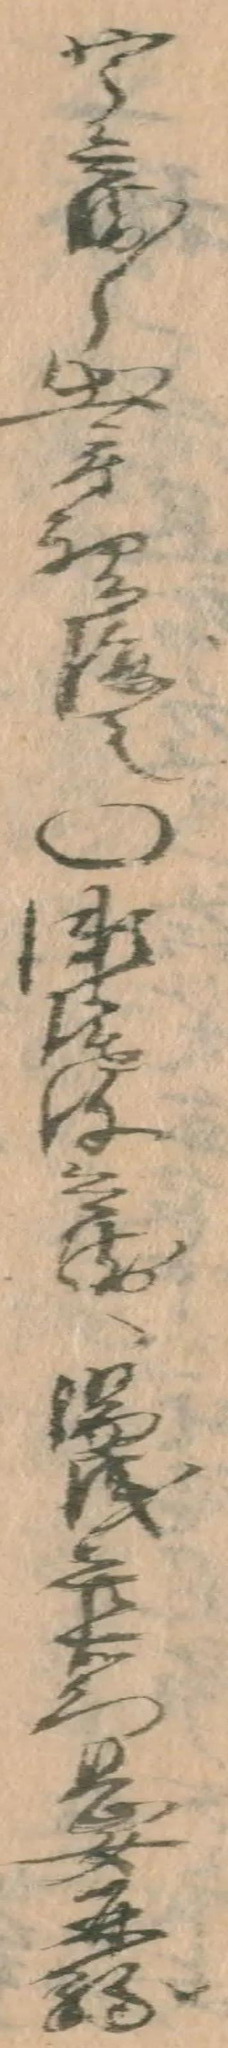宇兵衛申出ニ付初而渡之○瀬尾弥兵衛へ湯浅善右衛門息女再縁
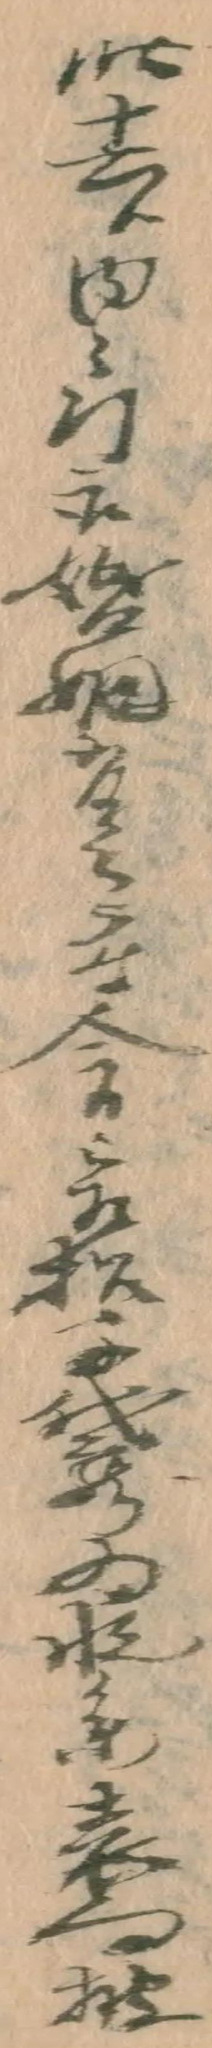昨十六日内々引取婚姻有之ニ付今日被相招千代蔵為祝参表向被
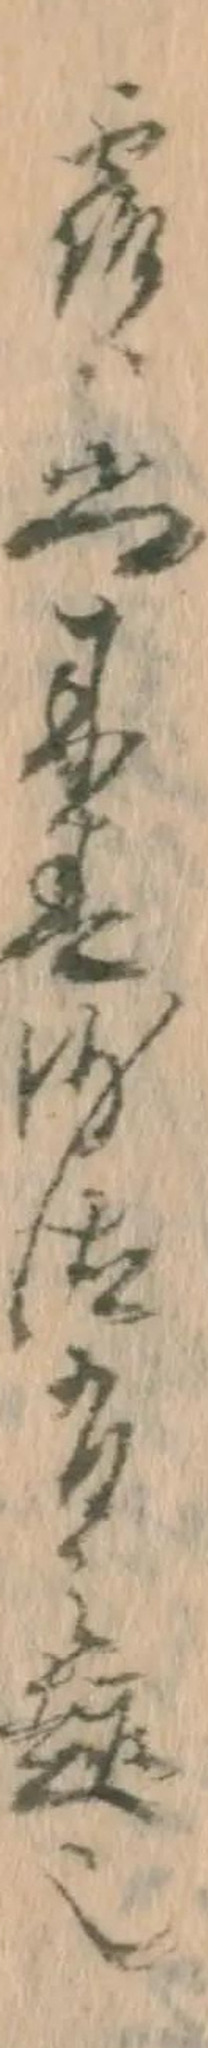露ハ尚来春沙汰有之趣也
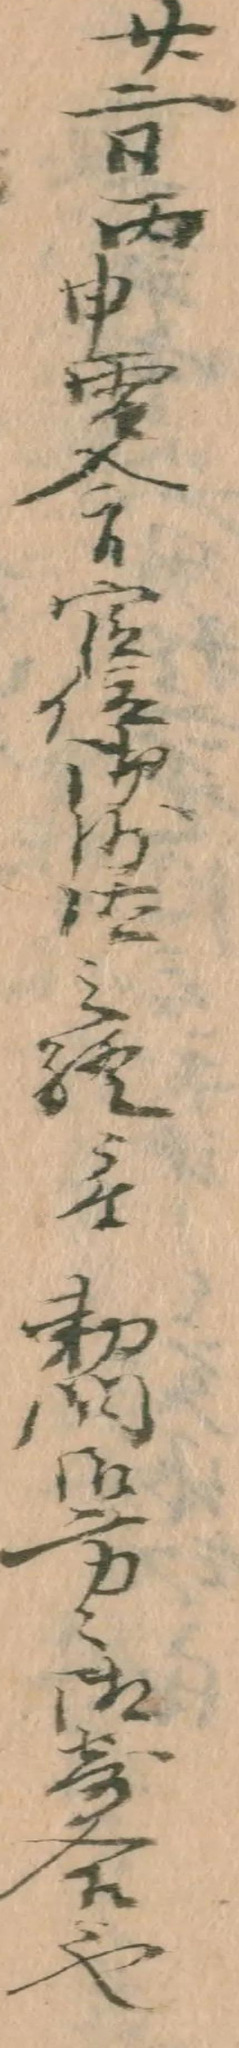廿二日丙申雪今日官位御沙汰之終ニ付勅問御方々御寄合也
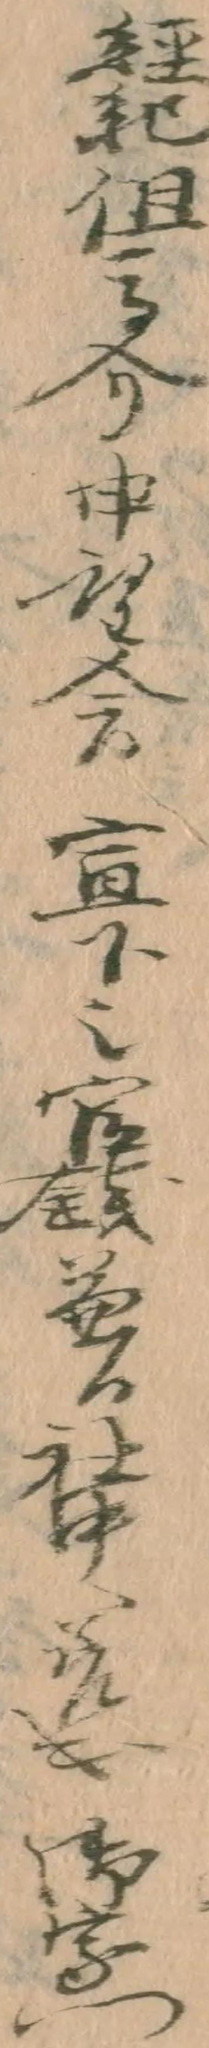経紀但馬介申望今日宣下之官銭兼日社中へ差出御家門
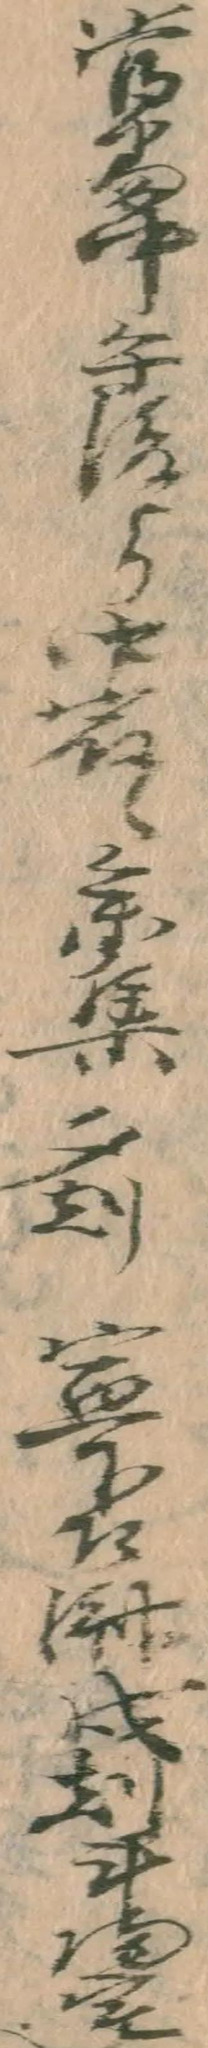当番中午後より中宿へ参集夕刻宣下相済戌刻斗帰宅也
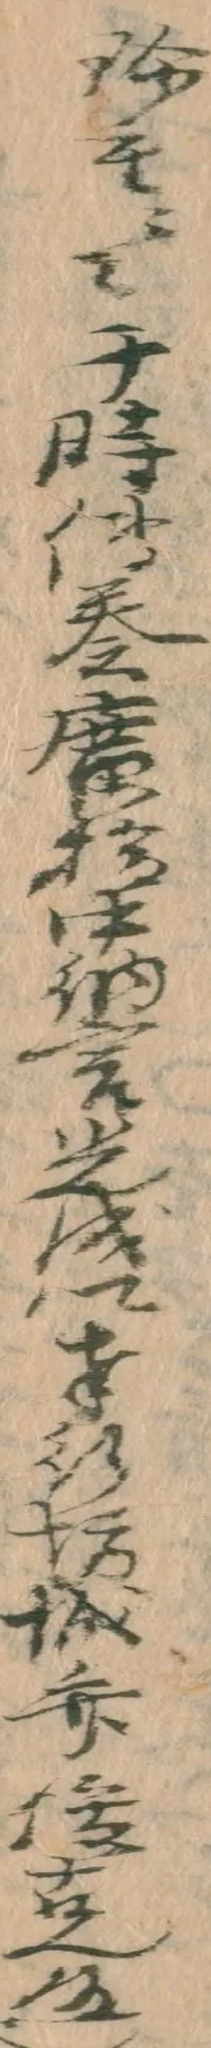珍重々々于時傳奏廣橋中納言光成卿奉行坊城弁俊克殿也
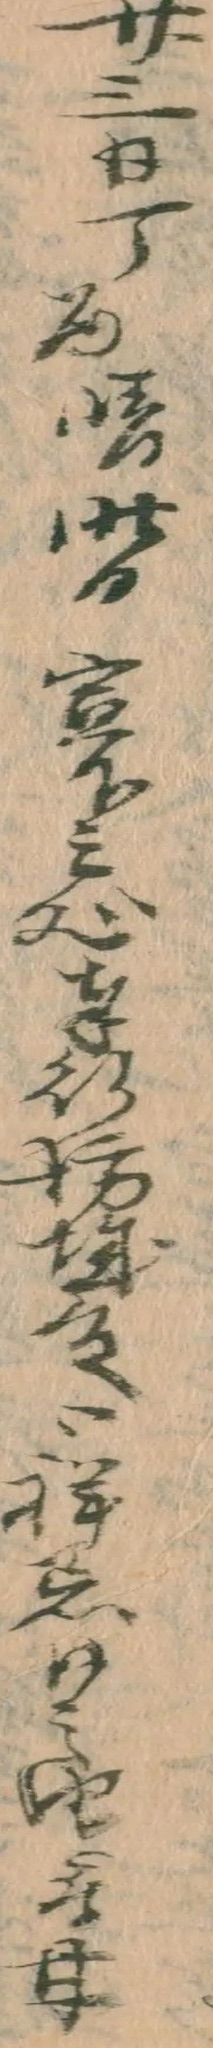廿三日丁酉晴昨日宣下之処奉行坊掛殿御祥忌日之由ニ付甘
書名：賀茂社記録. 第69冊
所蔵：国立国会図書館 National Diet Library, JAPAN
